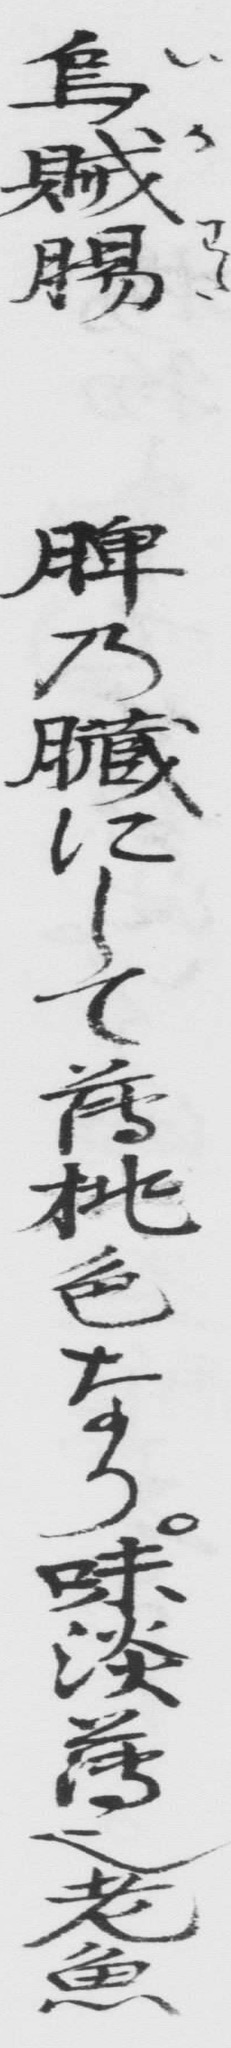烏賊腸脾の臓にして薄桃色なり。味淡薄也老魚
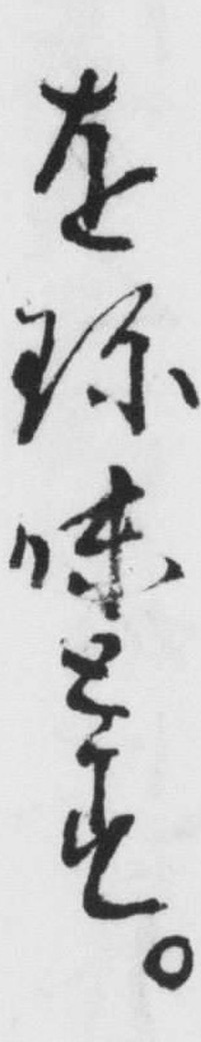を珍味とす。
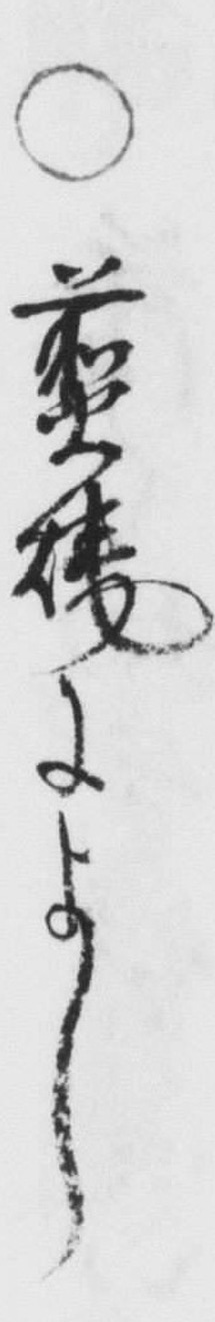○煎焼によし

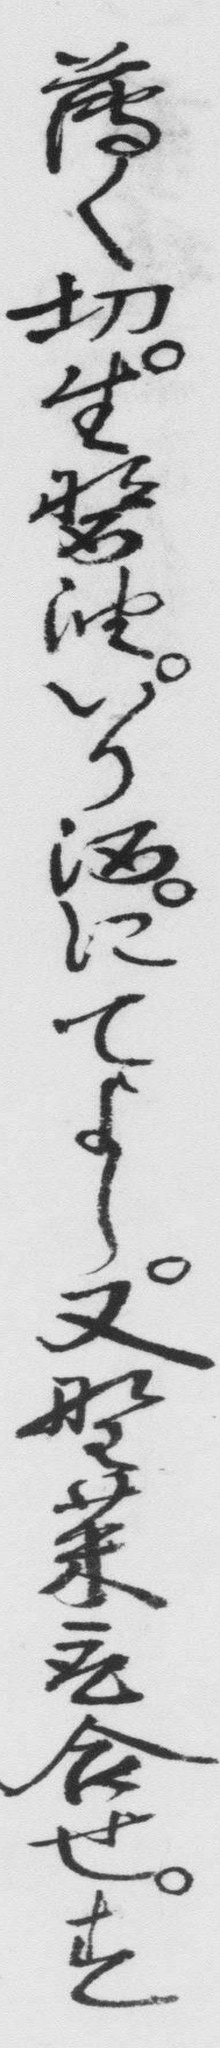○薄く切。生醤油。いり酒にてよし。又野菜取合せ。す
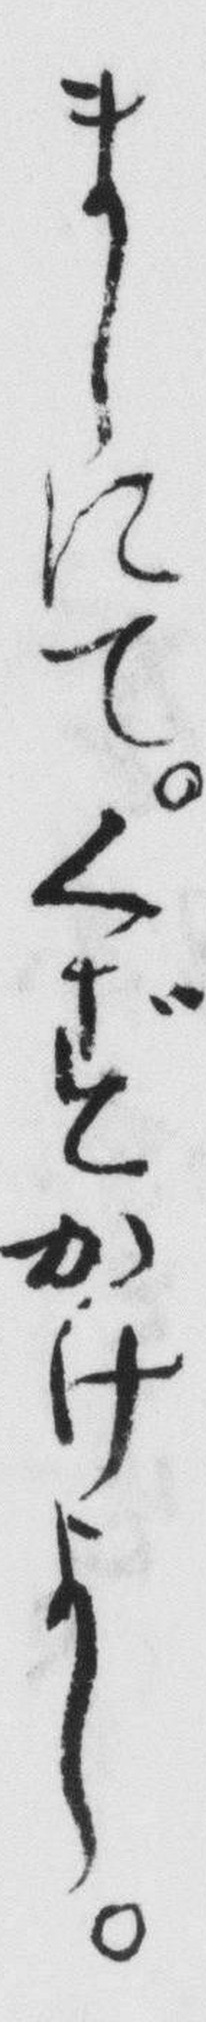ましにて。くずかけよし。
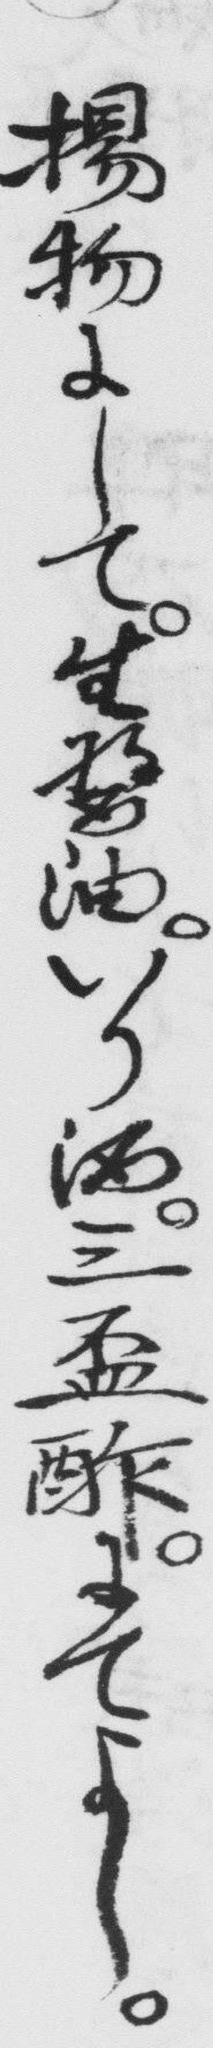○揚物にして。生醤油。いり酒。三盃酢。にてよし。
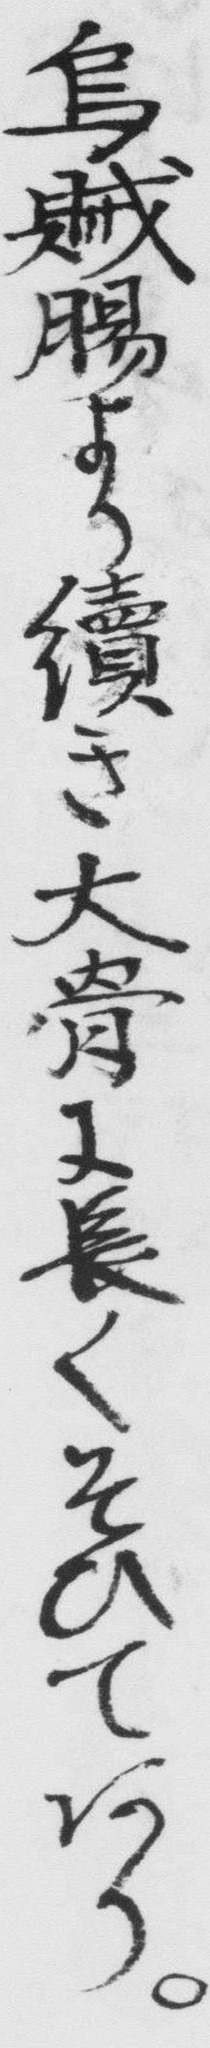腕貫烏賊腸より続き大骨に長くそひてあり。
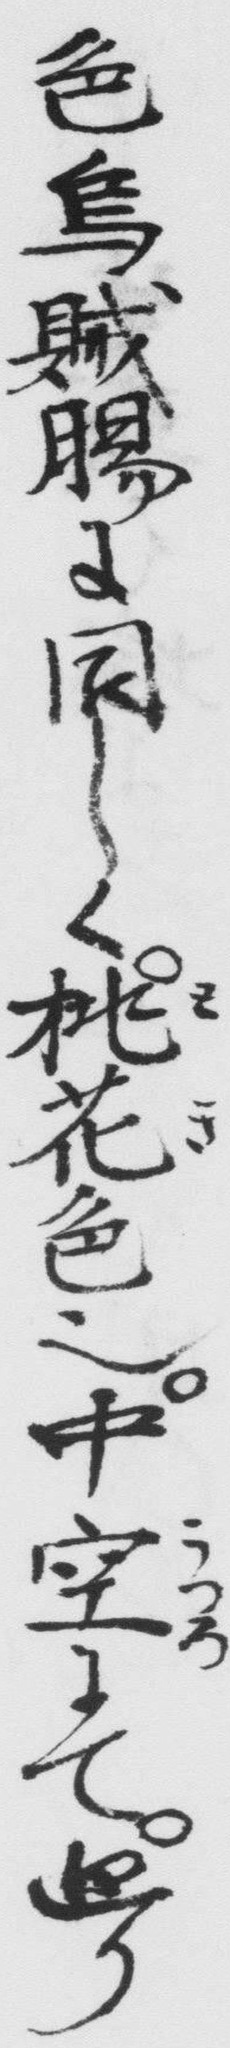色烏賊腸に同しく。桃花色也。中空にて。廻り
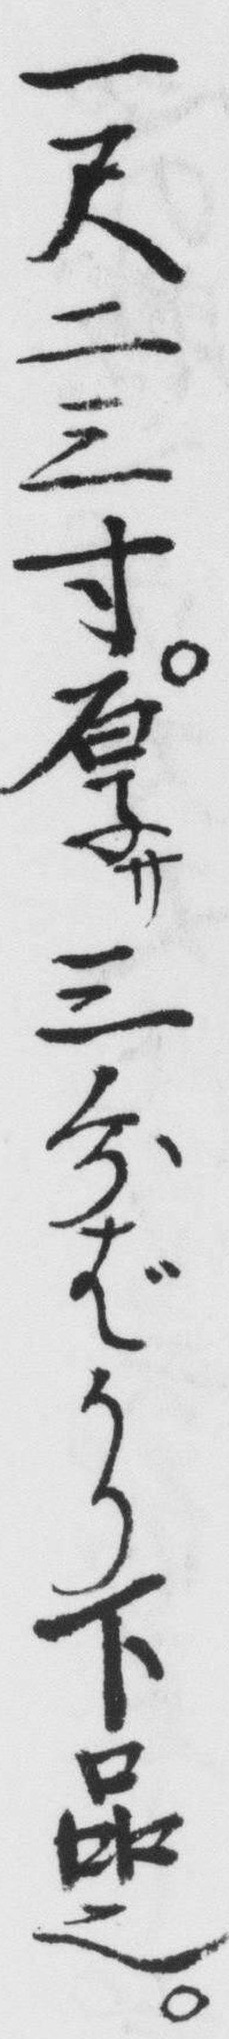一尺二三寸。厚サ三分ばかり下品也。
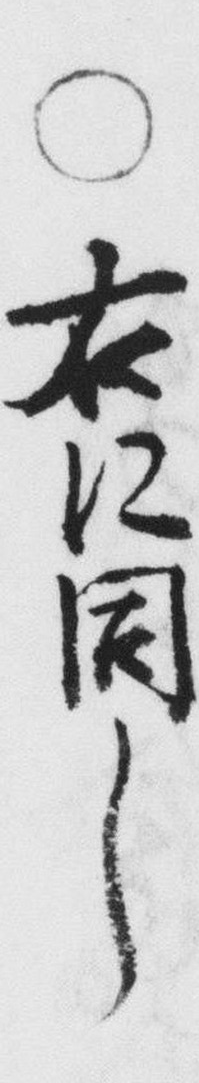○右に同し
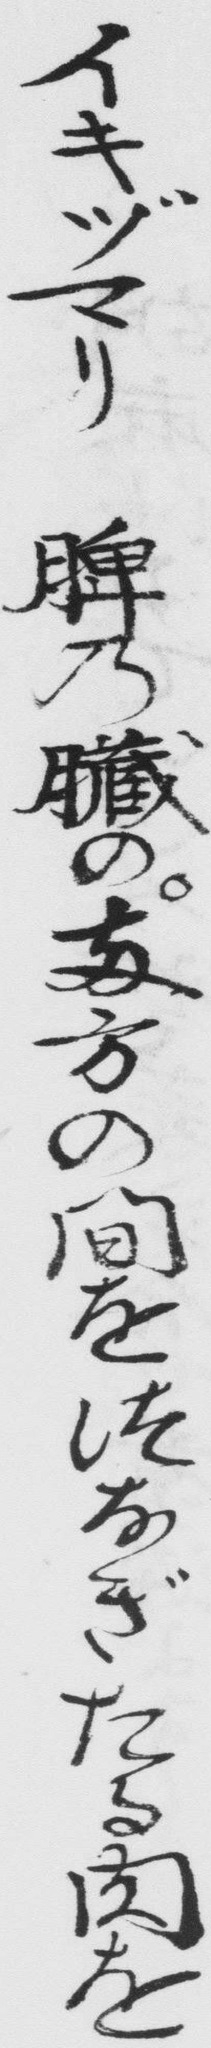イキヅマリ脾の臓の。両方の間をつなぎたる肉を
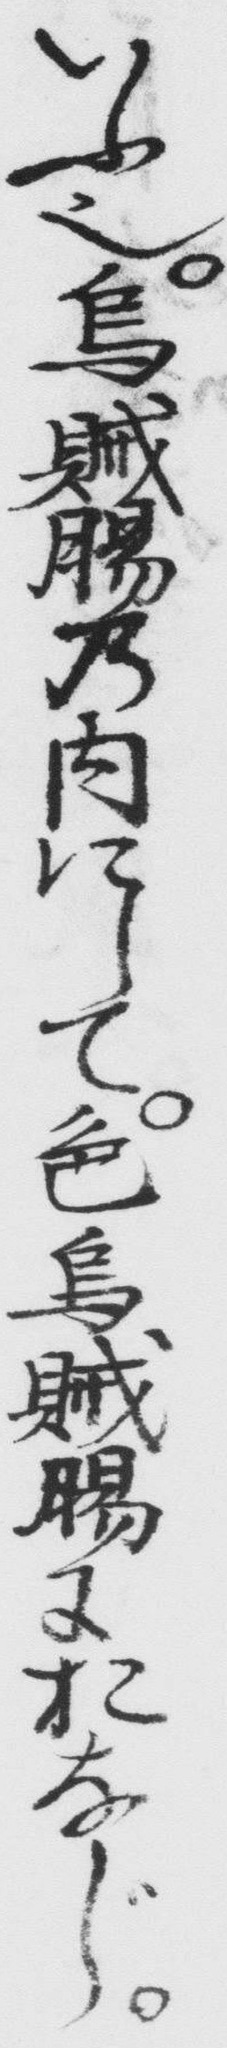いふ也。烏賊腸の内にして。色烏賊腸におなじ。
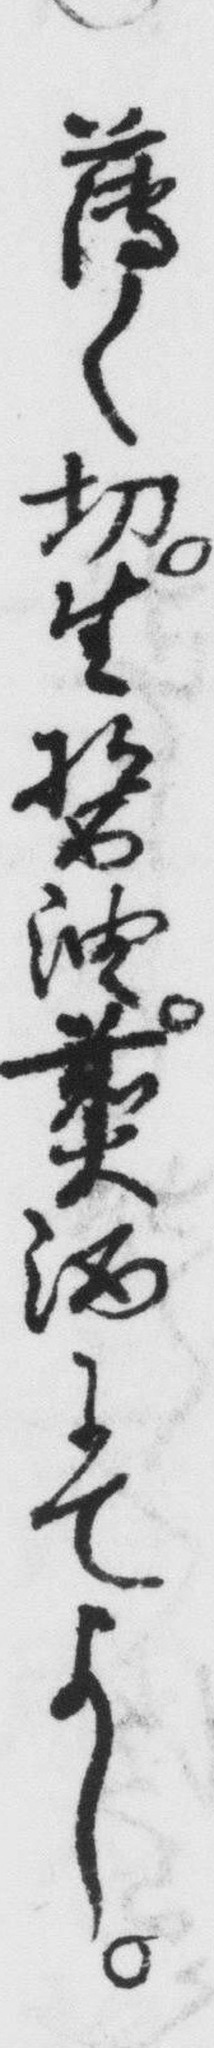○薄く切。生醤油。煎酒にてよし。
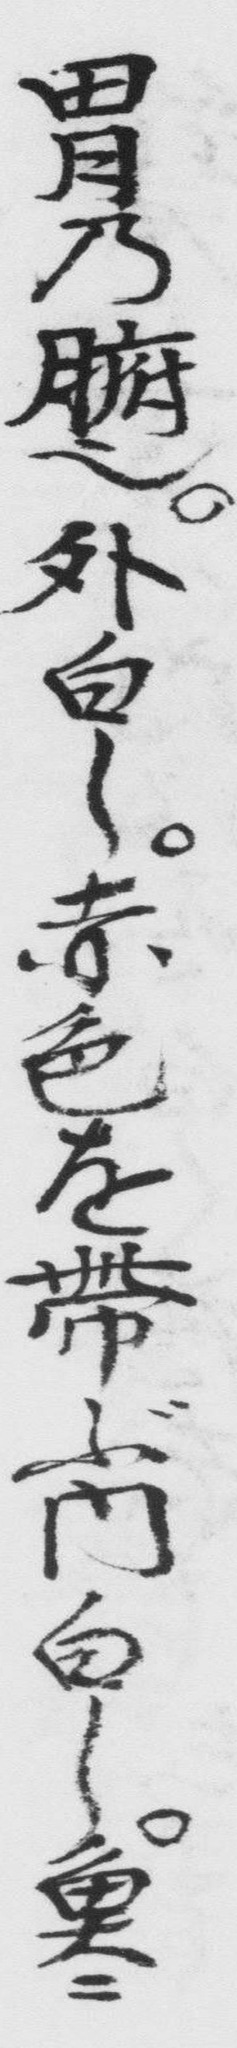丁字胃の腑也。外白し。赤色を帯ぶ内白し。魚に
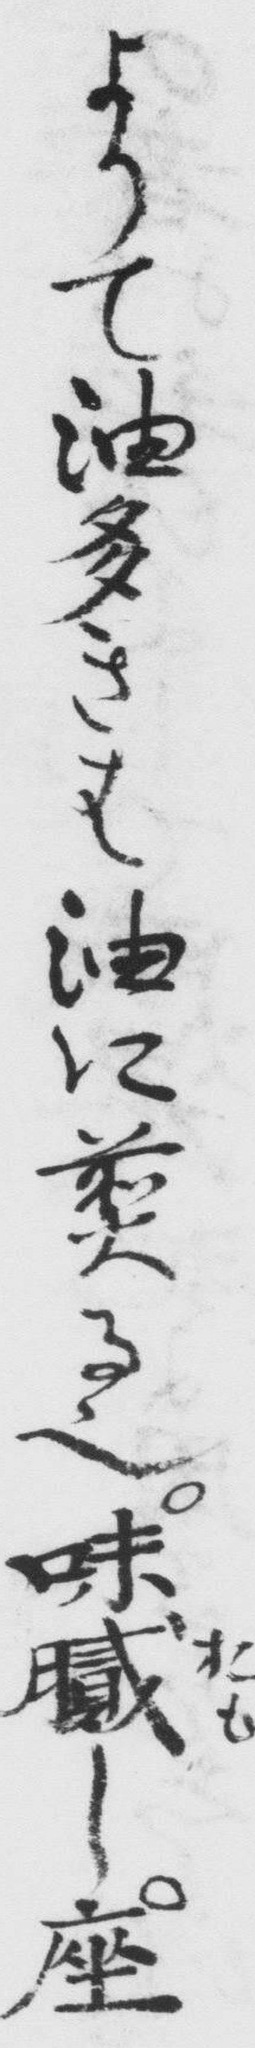よりて油多きは油に煎る也。味膩し。座
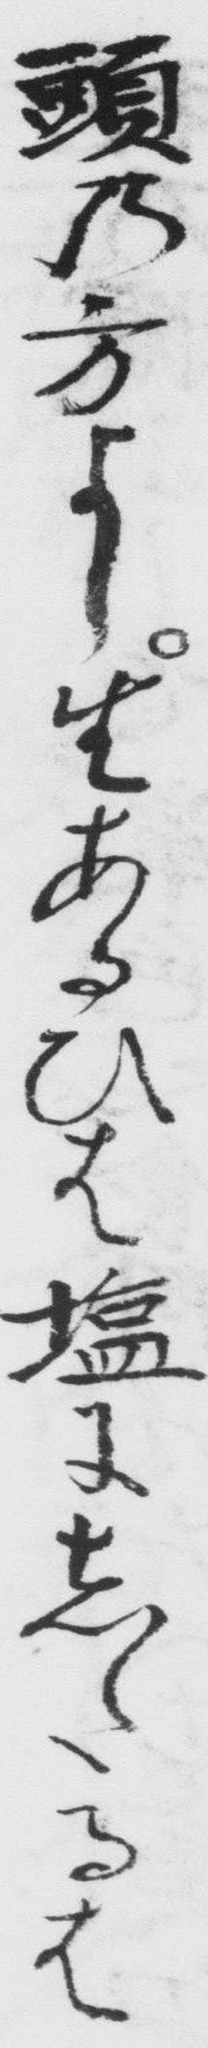頭の方よし。生あるひは塩にしたるは
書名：鯨肉調味方
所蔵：大阪府立大学学術情報センター 国文学研究資料館
